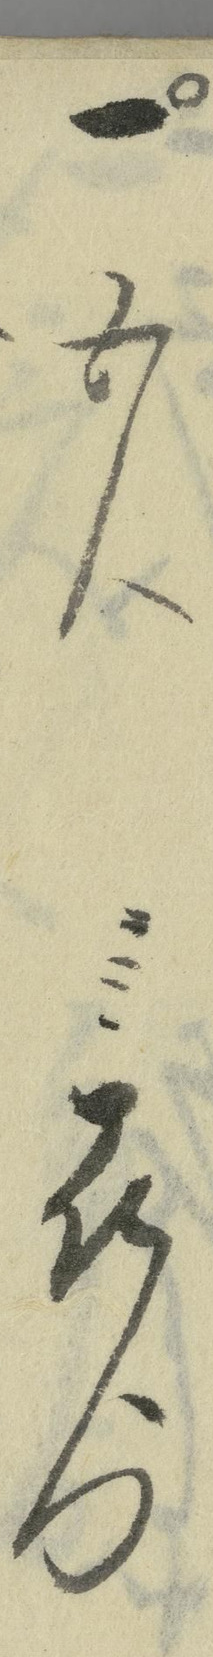○一三人嘉右衛門
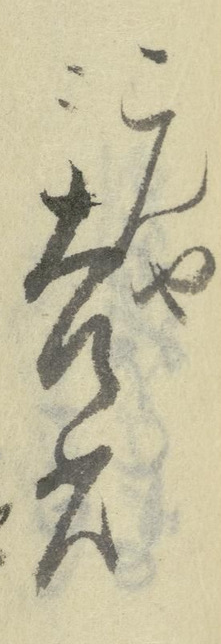武右衛門
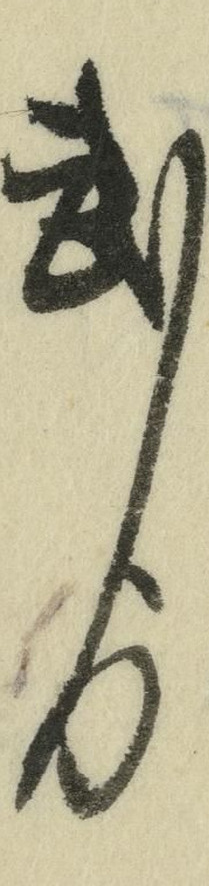武右衛門
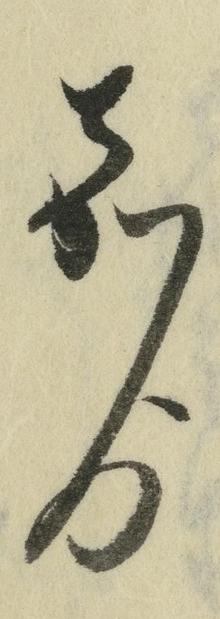武右衛門
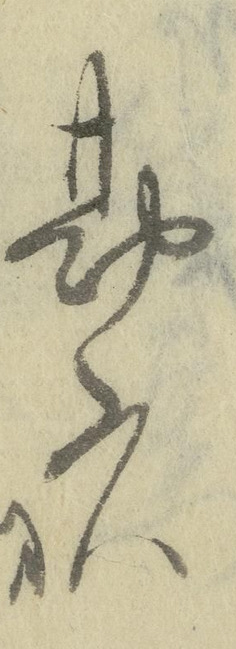武右衛門

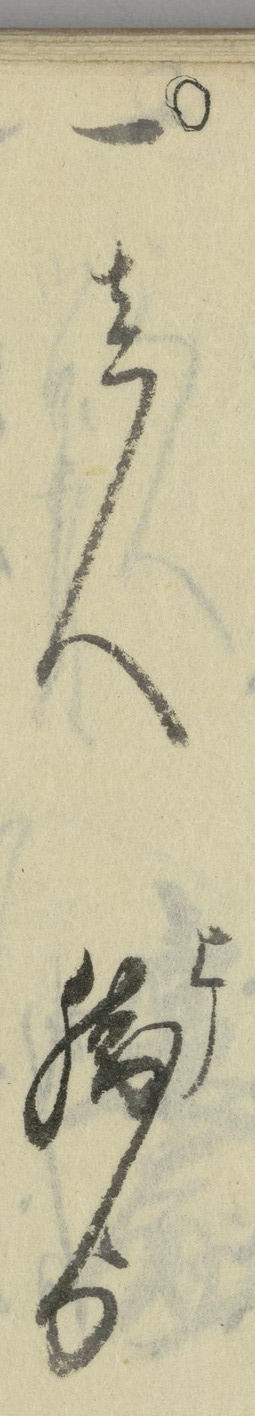○一壱人上ノ
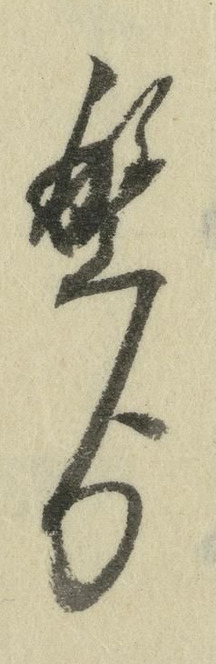勝右衛門
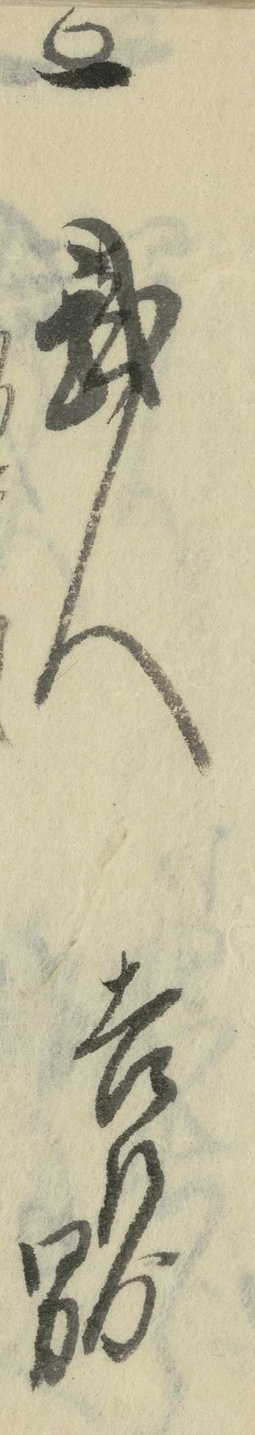○一弐人下ノ
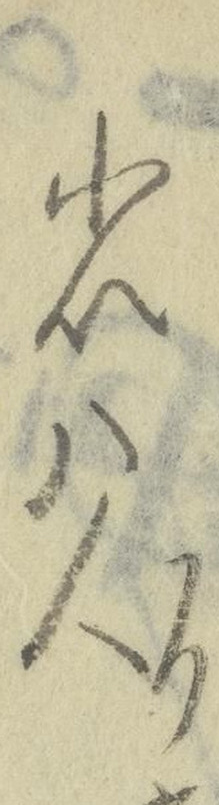小以八人
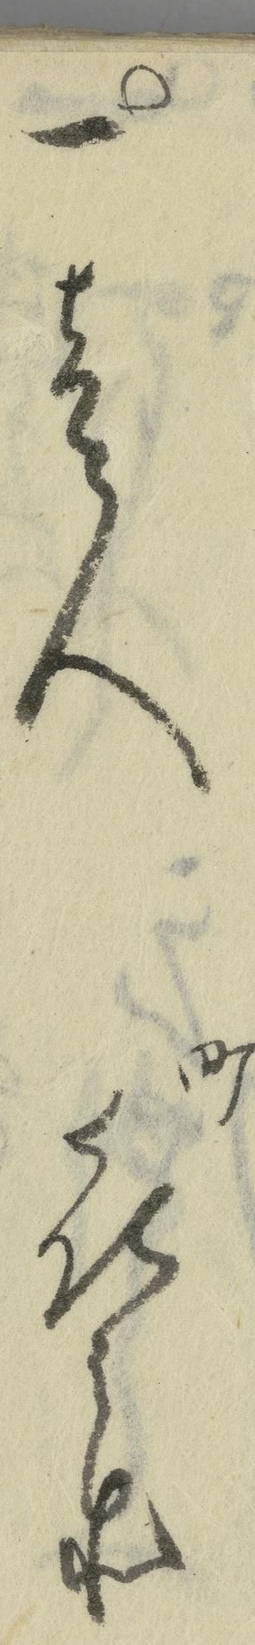○一壱人町
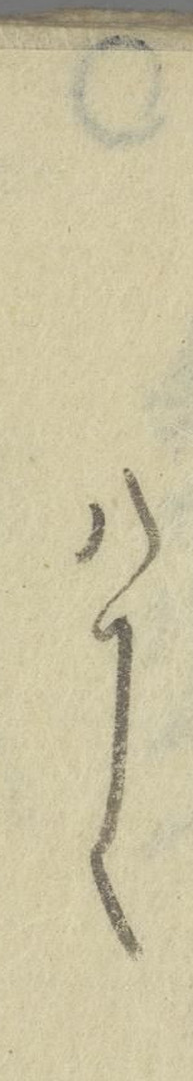八十文
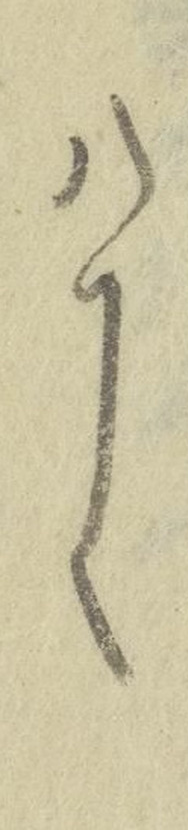八十文
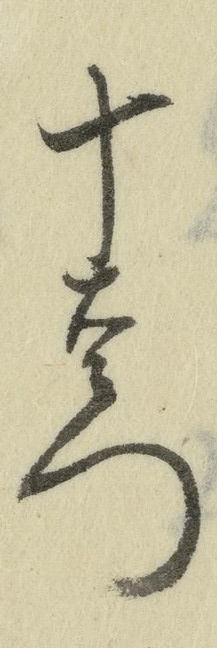勝右衛門
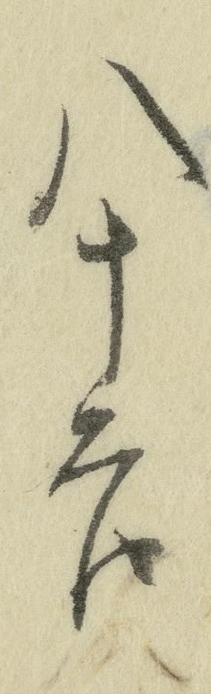八十文

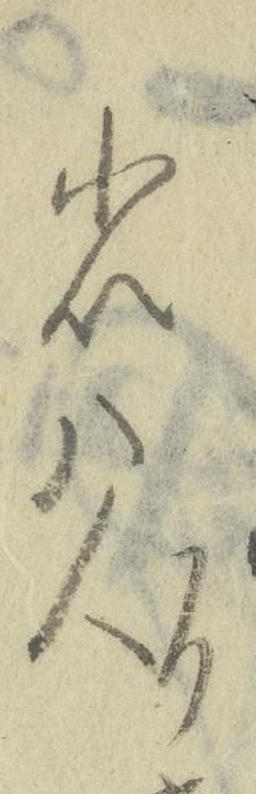小以十人
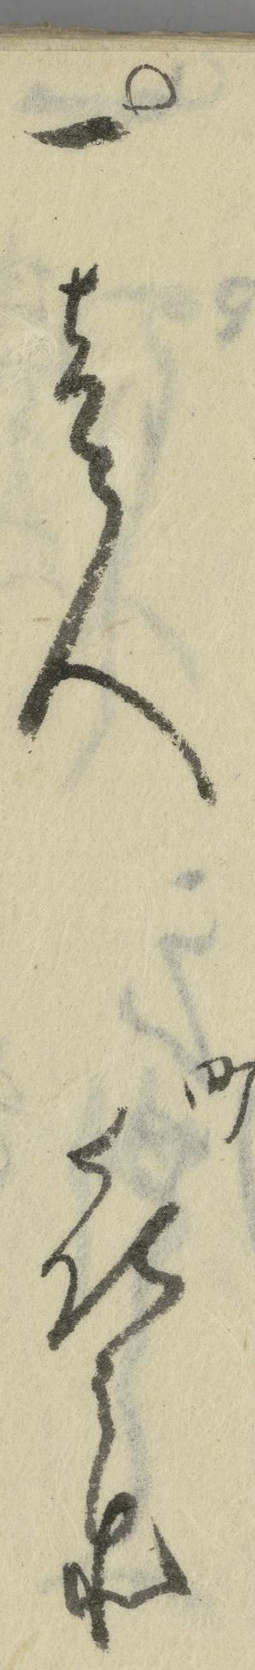○一壱人中町
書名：天明淺間噴火ニ関スル書類
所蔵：東京大学地震研究所図書室 Earthquake Research Institute Library, The University of Tokyo, JAPAN
